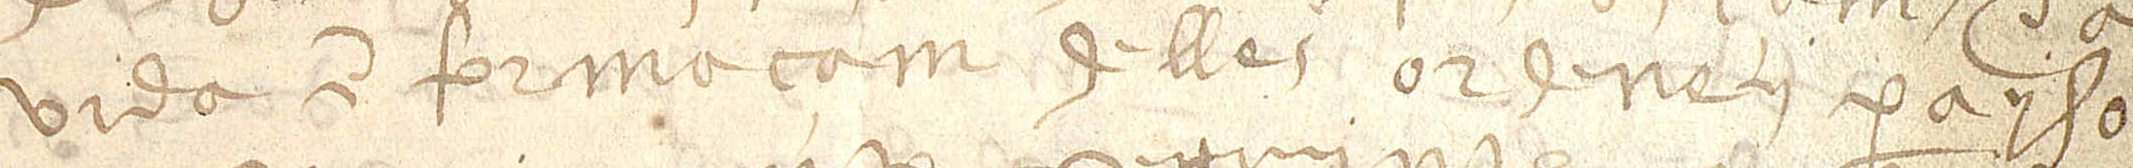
vida ēformaçam delles ordeney ꝑa yso
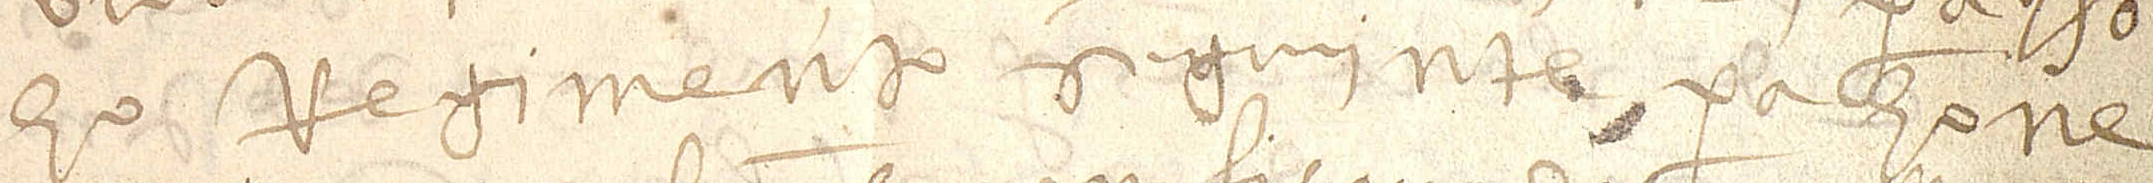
ho Regimento seguinte ꝑa ho ne
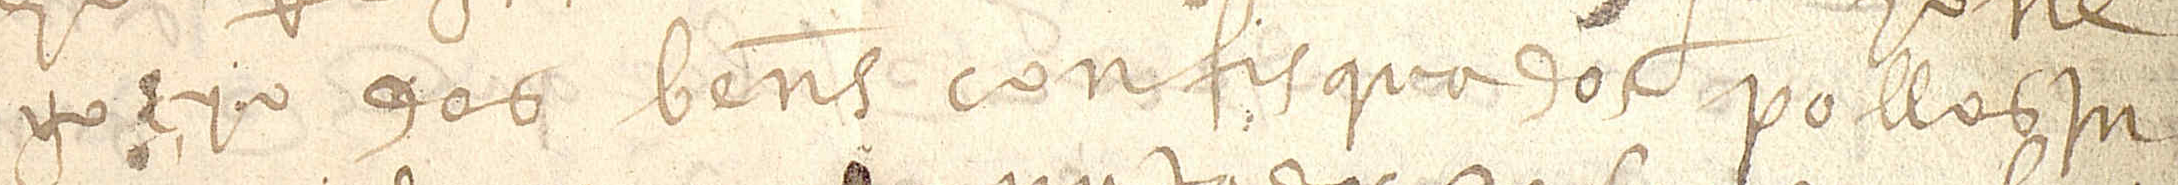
gocyo dos bēns confisquados pollos Jn
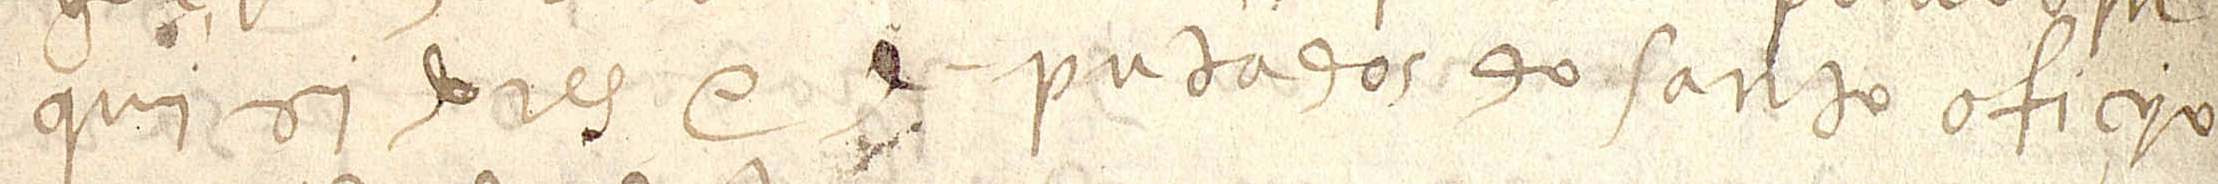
quysydores e deputados do santo oficyo
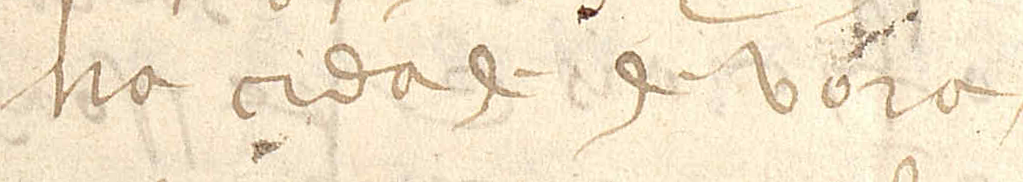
na cidade devora
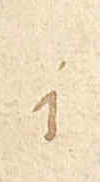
1
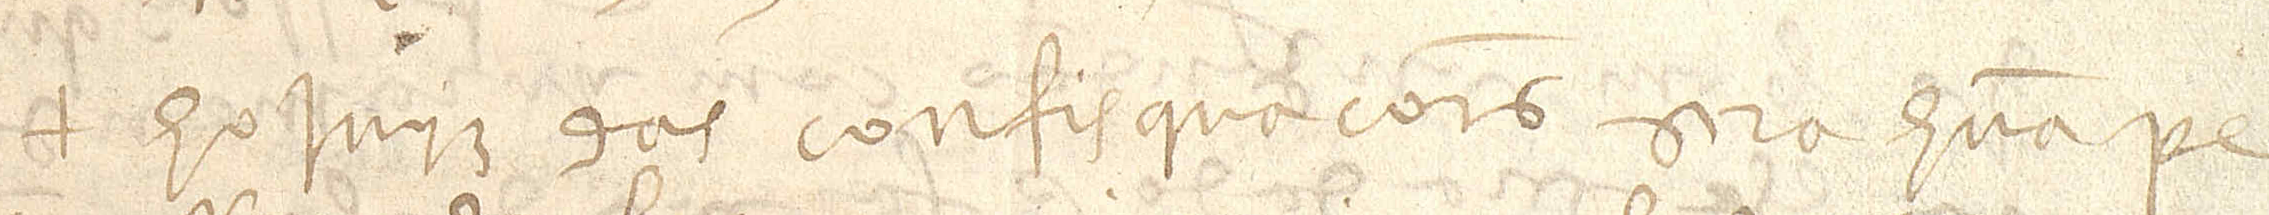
item ho Juiz das confisquações sera hūa pe
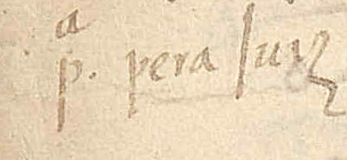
p.a pera Juiz
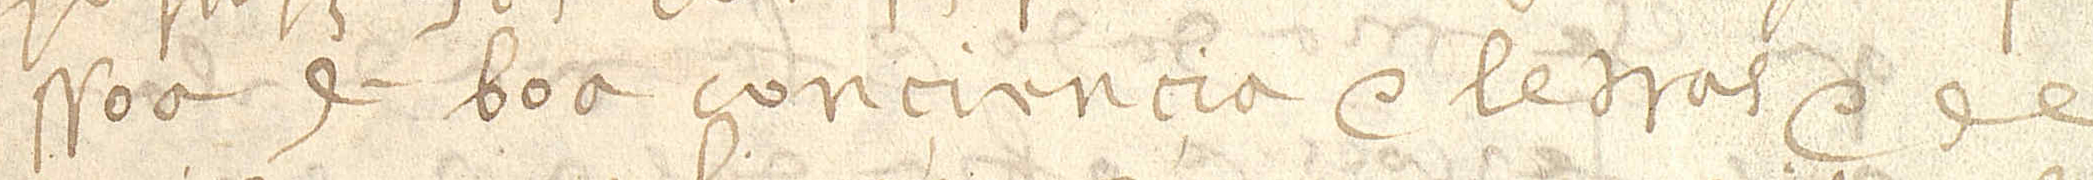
ssoa de boa conciencia e letras e de
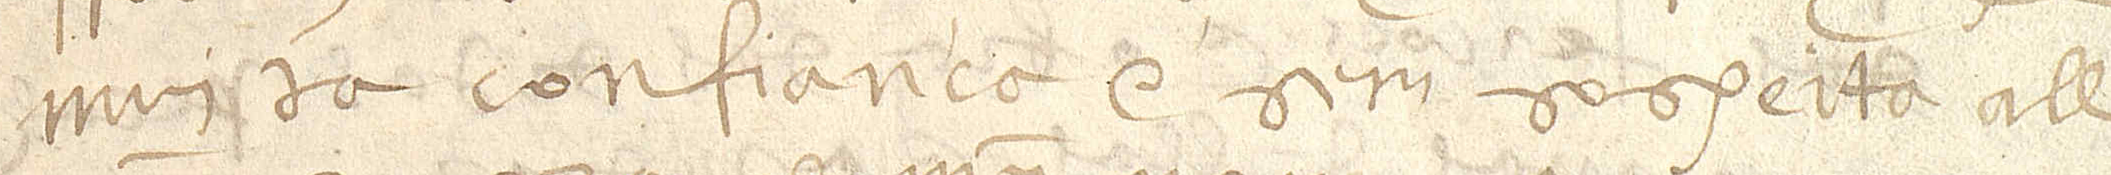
mujta confiança e sem sospeita all
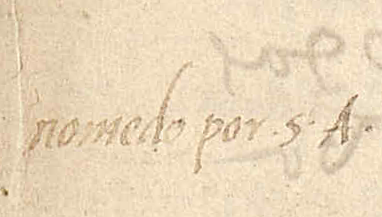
nomedo por S. A.
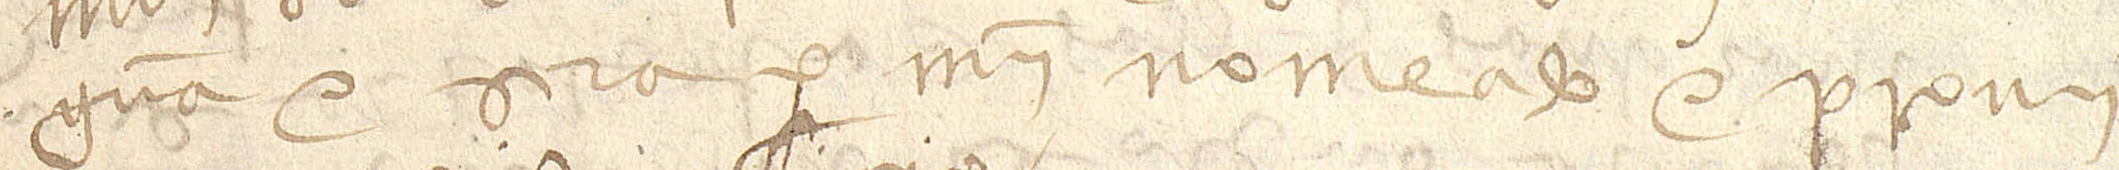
gūa e sera ꝑ mȳ nomeado e prouy
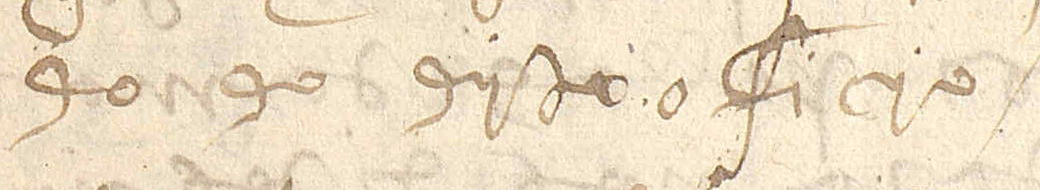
do do dyto oficyo /
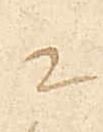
2
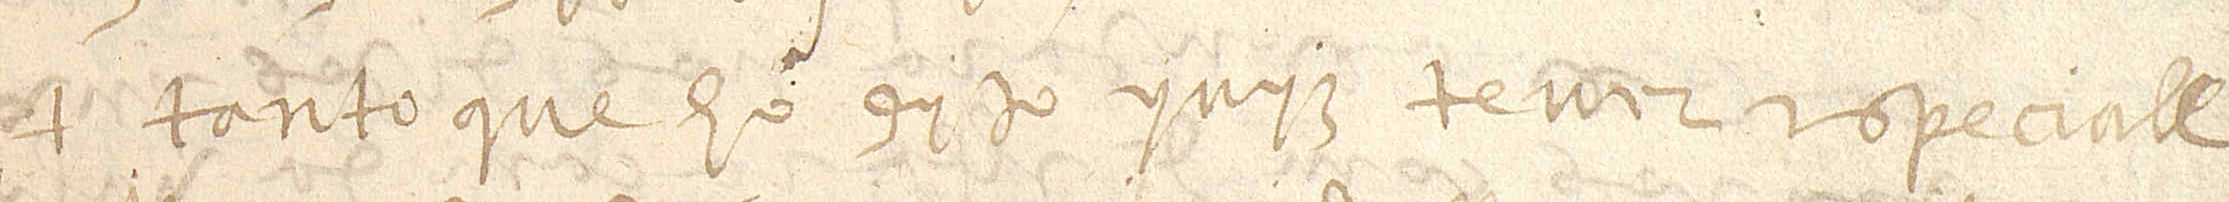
item tanto que ho dyto yuyz teuer especiall
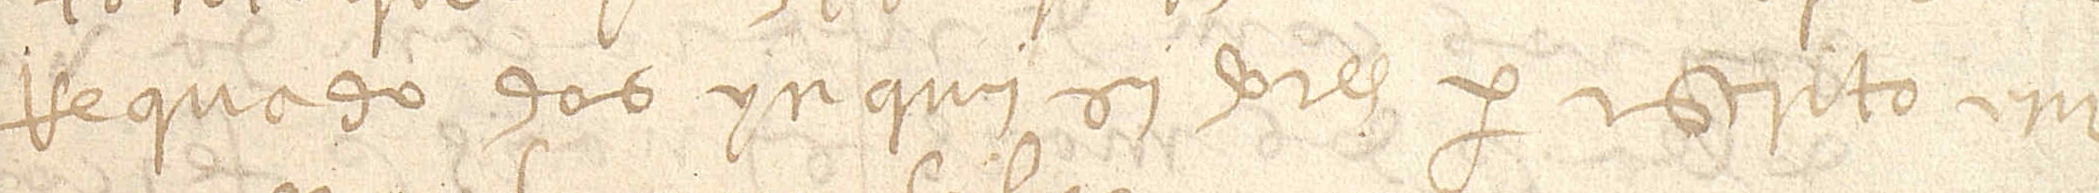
Requado dos ynquysydores ꝑ escrito em
